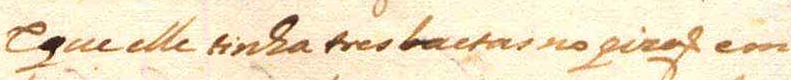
e que elle tinha tres baetas no pizaõ em
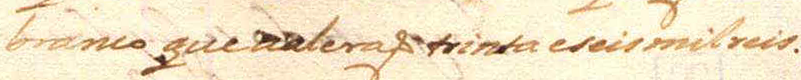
branco que valeraõ trinta e seis mil reis.
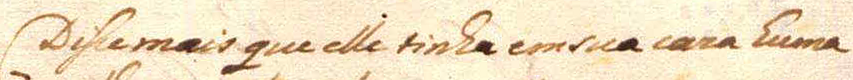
Disse mais que elle tinha em sua caza huma
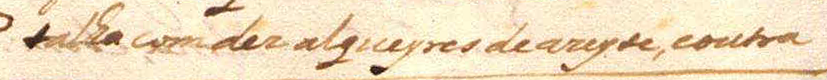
talha com dez alqueyres de azeyte, e outra
